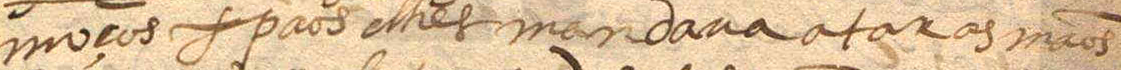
moços xpãos e lhes mandaua atar as mãos
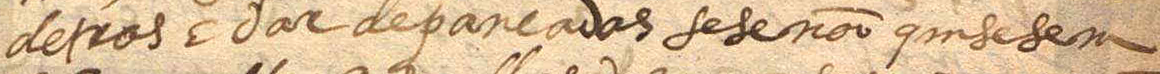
detras E dar de pancadas se se não quisesem
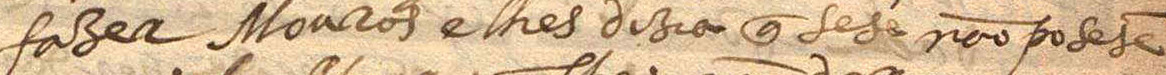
fazer Mouros e lhes dizia q̄ se se não posesē
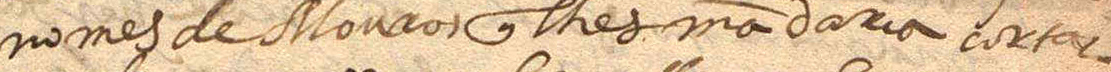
nomes de Mouros q̄ lhes mādaria cortar
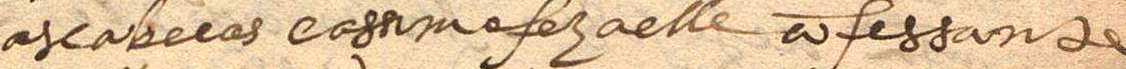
as cabecas e assim o fez a elle c̄ofessante
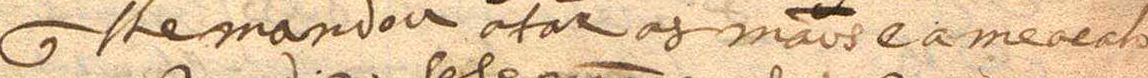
q̄ lhe mandou atar as mãos e ameacalo
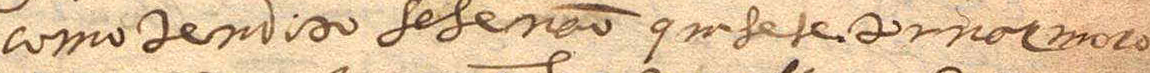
como ten dito se se não quisese tornar moro
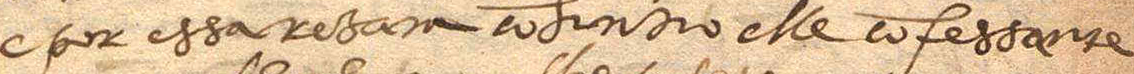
e por essa rezam c̄osentio elle c̄ofessante
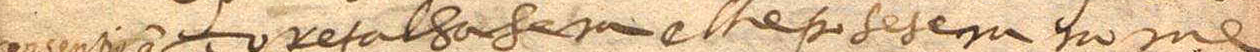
q̄ o retalhasem e lhe posesem nome
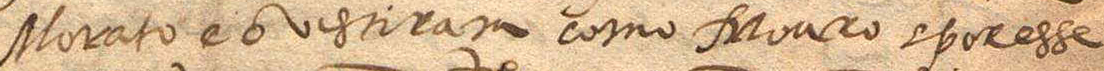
Morato e o vestiram como Mouro E por esse
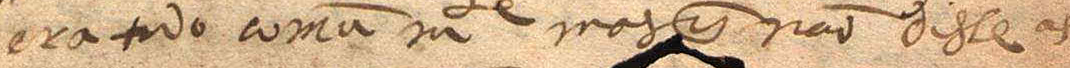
era tido comūmte mas q̄ naõ disse as
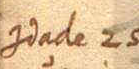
Jdade 25
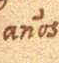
an̄os
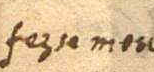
fezse mou
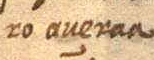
ro aueraa
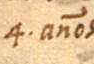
4. an̄os.
